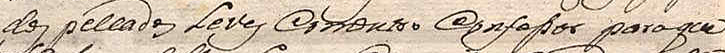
dos peccados leves com outro confessor para que
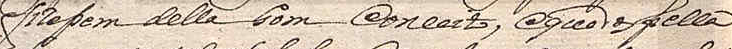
fizessem della bom conceito, e que dos pecca
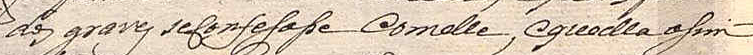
dos graves se confesasse com elle, e que ella asim
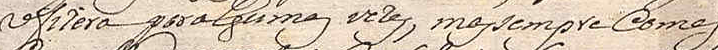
o fizera por algumas vezes, mas sempre com es
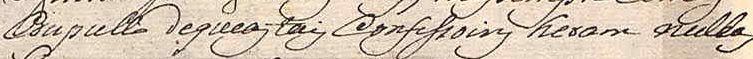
crupullo de que as tais confessoins heram nullas.
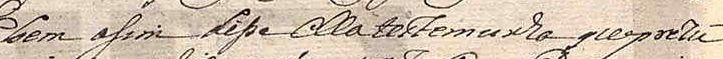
E bem assim disse ella testemunha que prezu
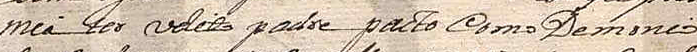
mia ter o dito padre pacto com o Demonio
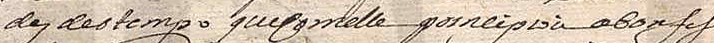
desde o tempo que com elle principiou a confes
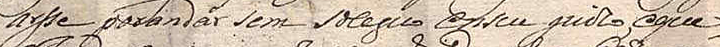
arsse por andar sem soceguo en seu juizo, e que
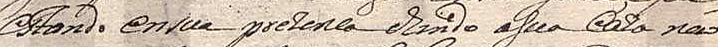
estando en sua prezenca e hindo a sua caza naõ
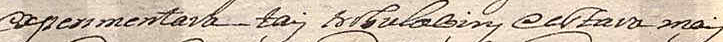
experimentava tais trobulacoins e estava mais
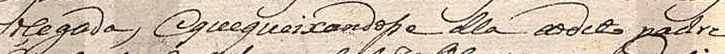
soçegada, e que queixandosse ella ao dito padre
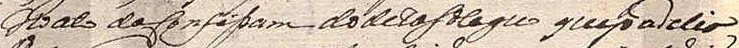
no ato da Confissam do dezasoceguo que padecia
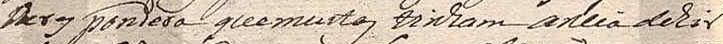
lhe respondera que muitas tinham ancia de hir
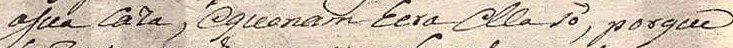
a sua caza, e que nam hera ella só, porque
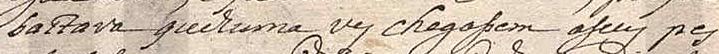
bastava que huma vez chegassem a seus pes
